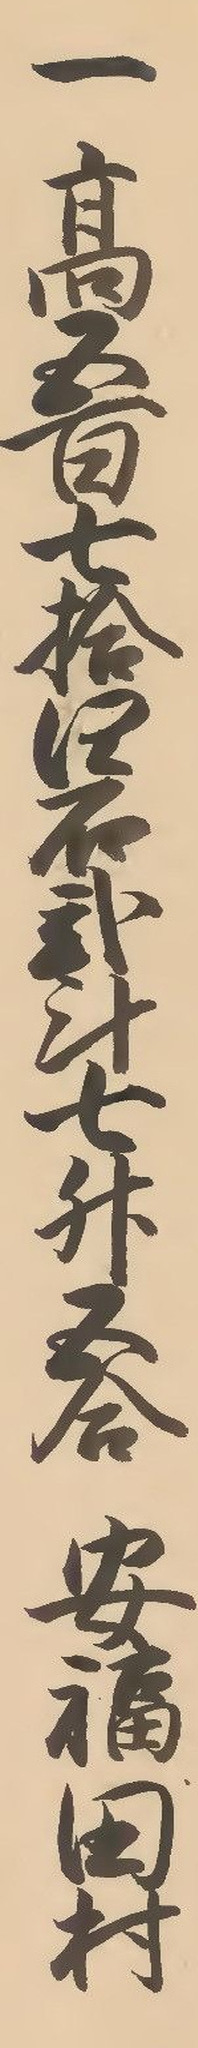一髙五百七拾四石弐斗七升五合安福田村
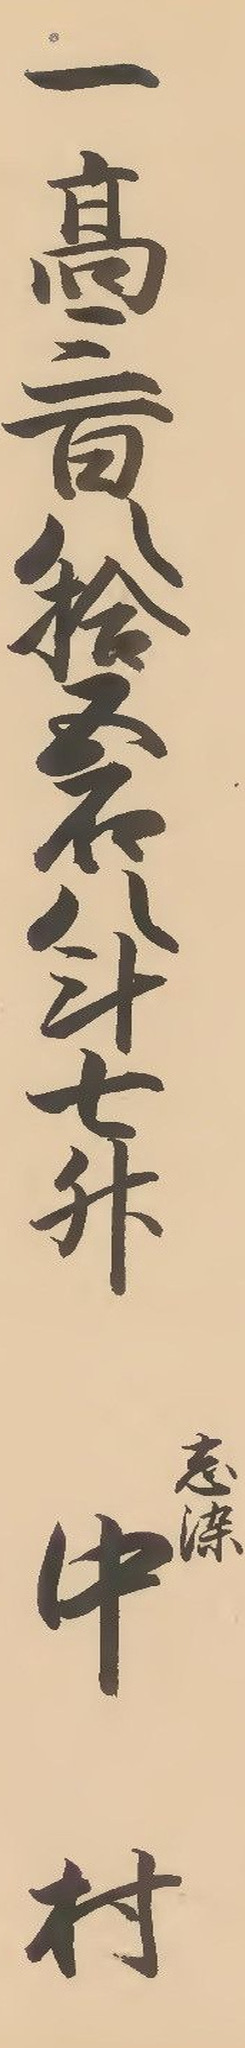一髙三百八拾五石八斗七升中村
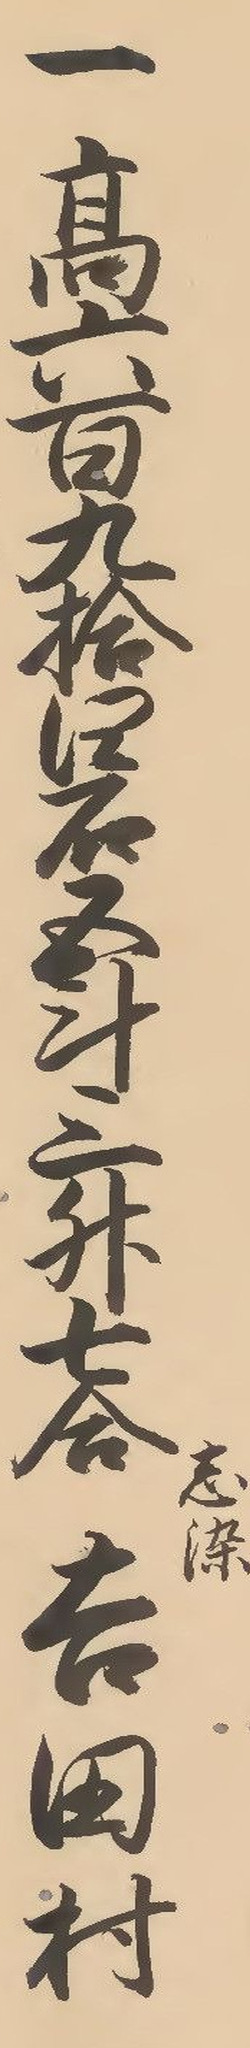一髙六百九拾四石五斗三升七合吉田村

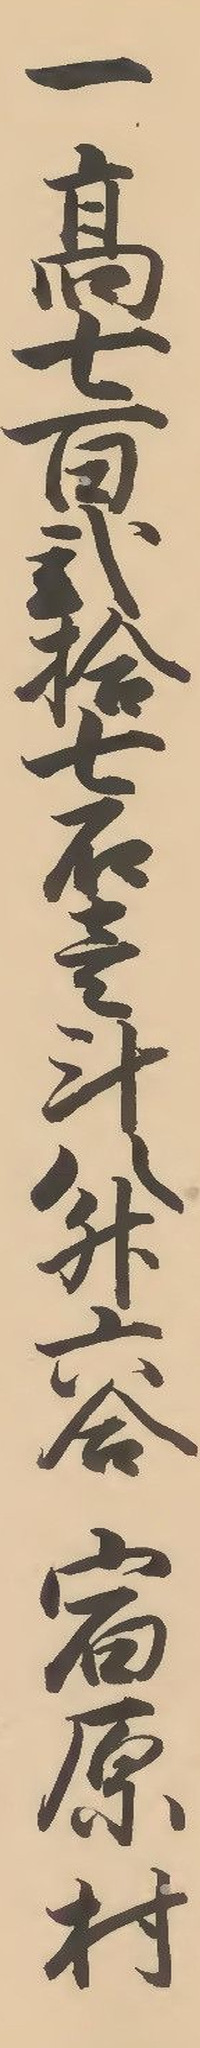一髙七百弐拾七石壱斗八升六合宿原村
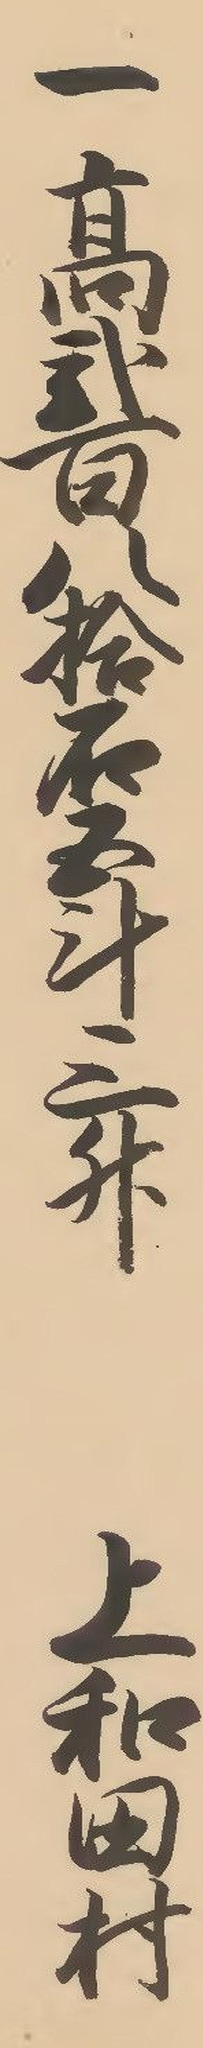一髙弐百八拾石五斗三升上和田村
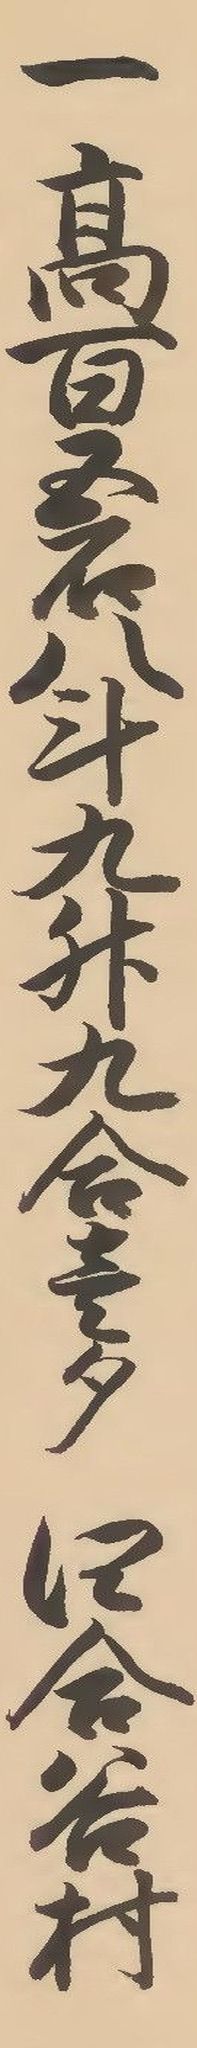一髙百五石八斗九升九合壱夕四合谷村
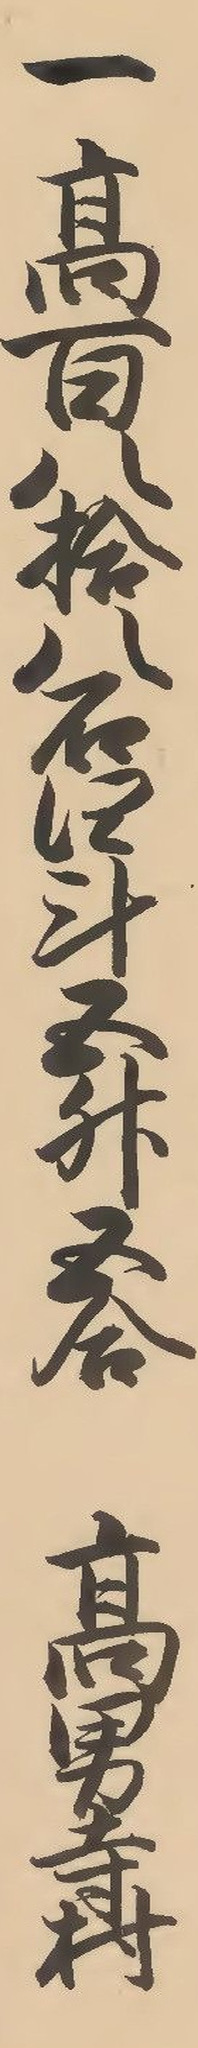一髙八拾八石四斗五升五合髙男寺村
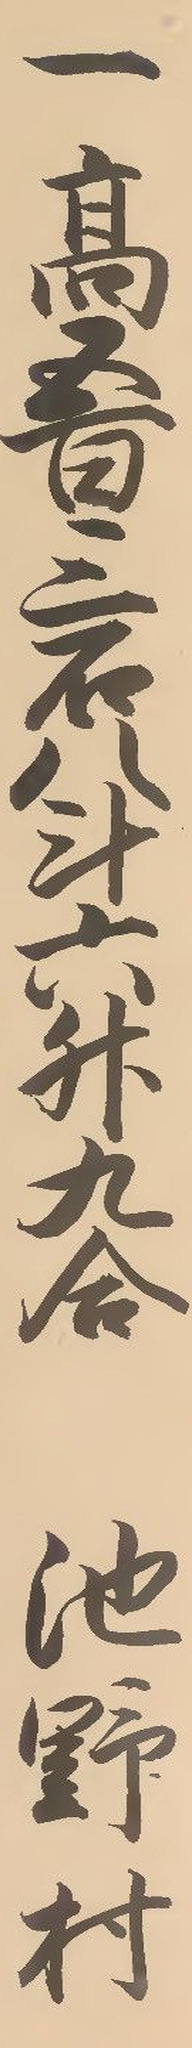一髙五百三石八斗六升九合池野村
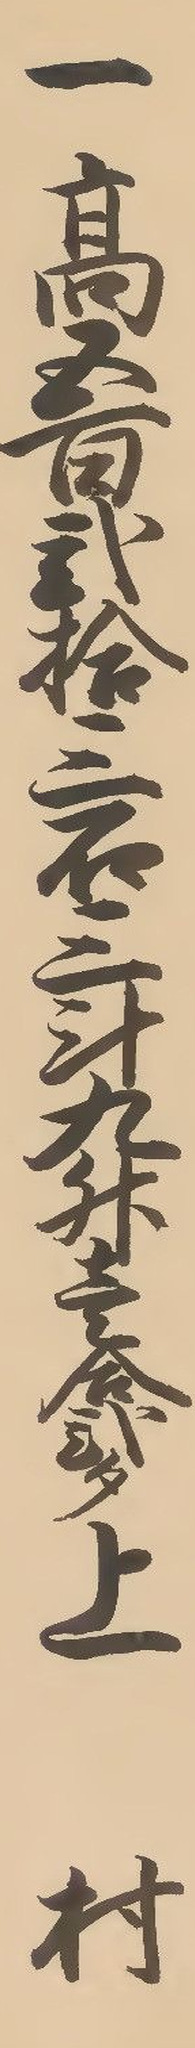一髙五百弐拾三石三斗九升壱合弐夕上村
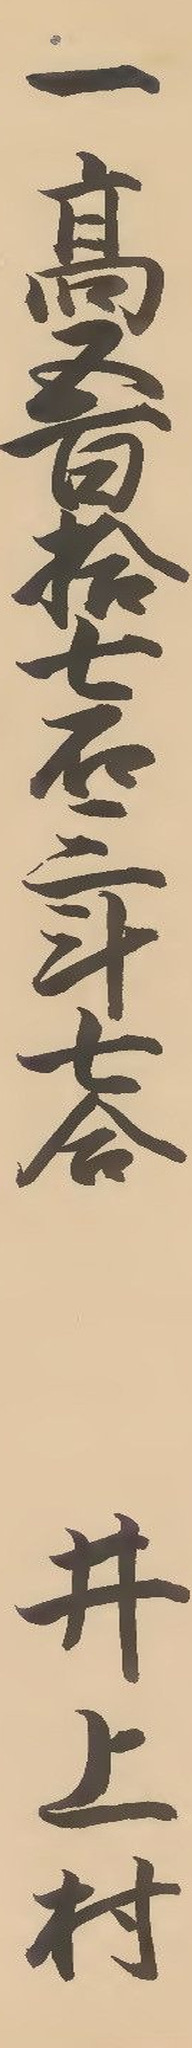一髙五百拾七石三斗七合井上村
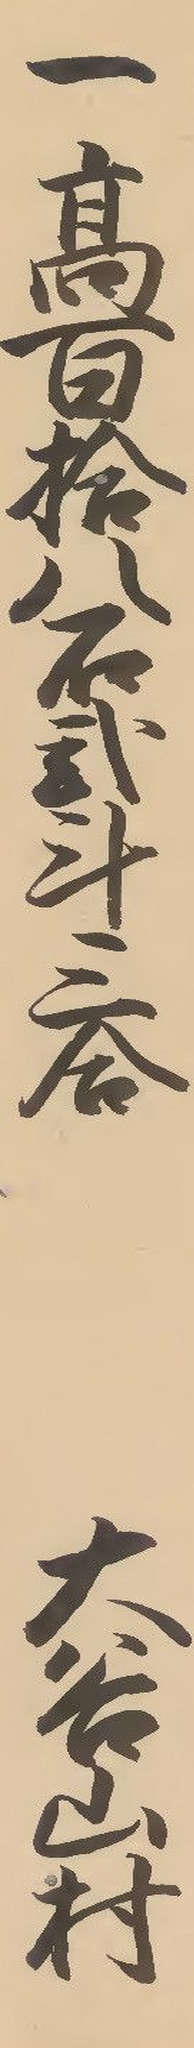一髙百拾八石弐斗三合大谷山村

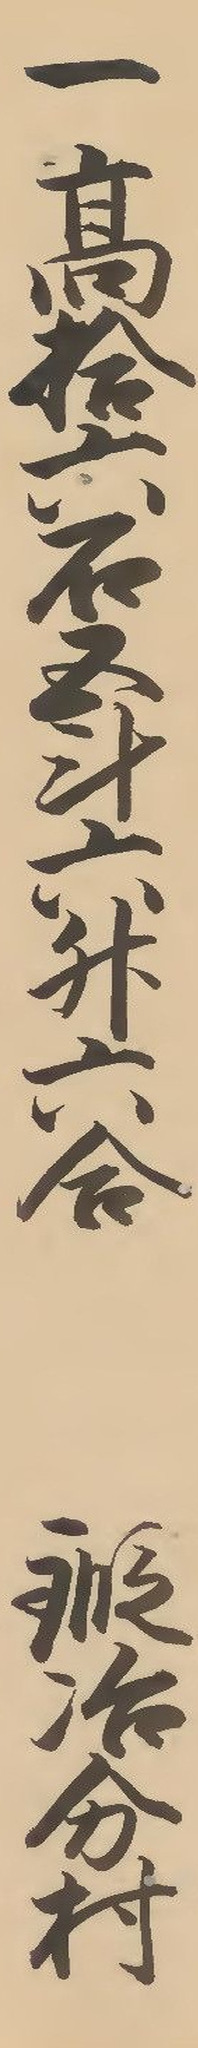一髙拾六石五斗六升六合鍛冶分村
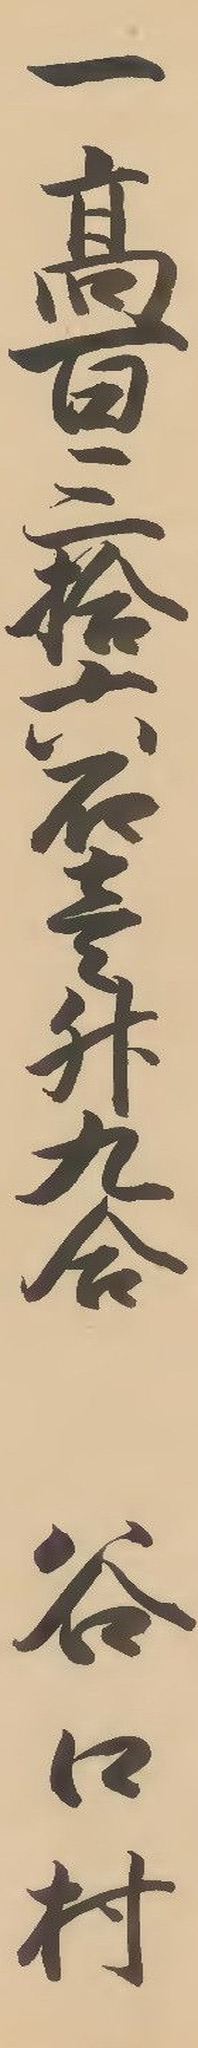一髙百三拾六石壱升九合谷口村
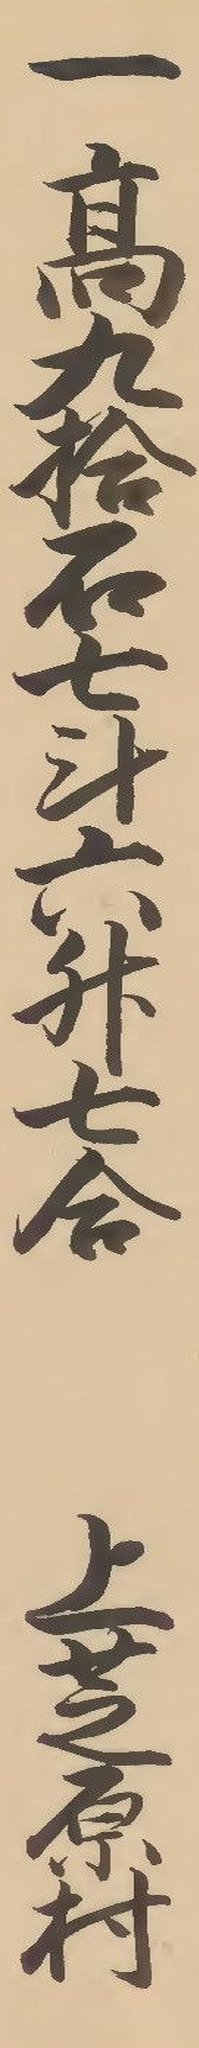一髙九拾石七斗六升七合上芝原村
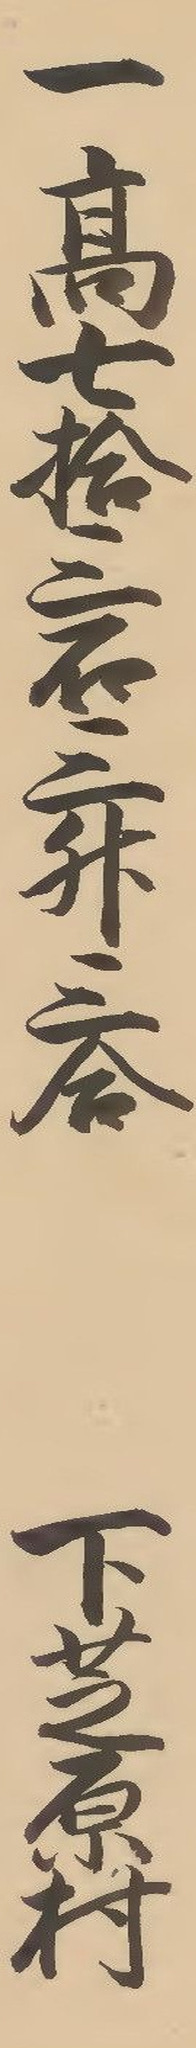一髙七拾三石三升三合下芝原村
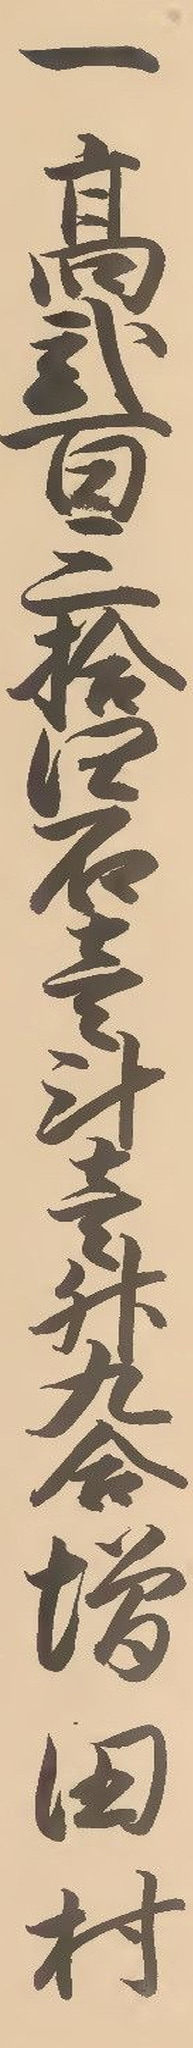一髙弐百三拾四石壱斗壱升九合増田村
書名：播磨国郷帳
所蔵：国立公文書館 National Archives of Japan
